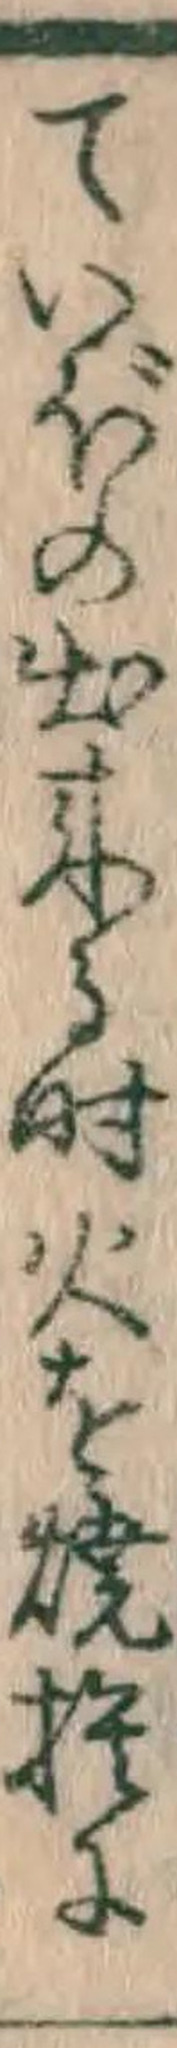ていぼの出来る時火を焼捨に
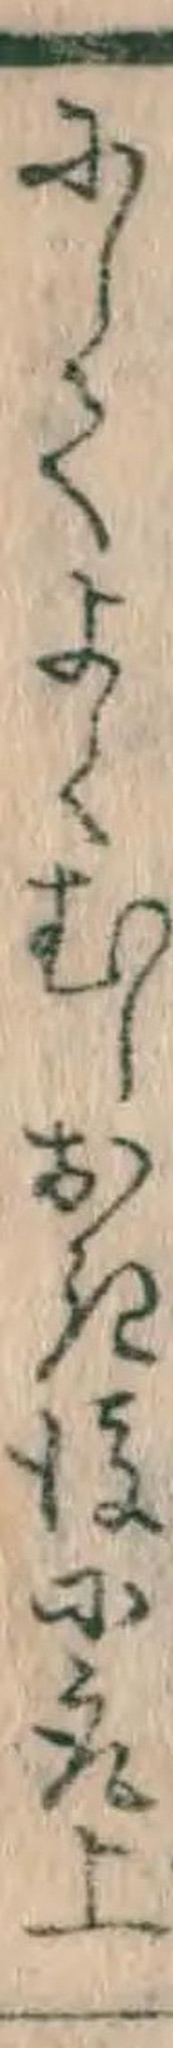にしてよくむしおき後に取上
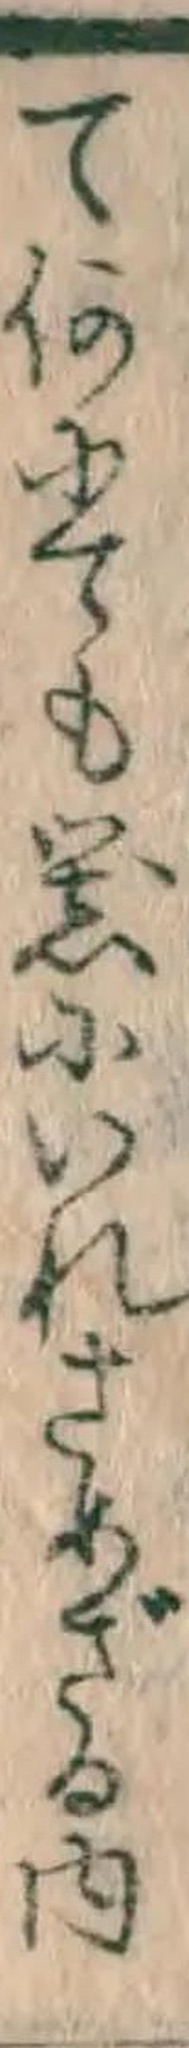て何にても器にいれさめざる内
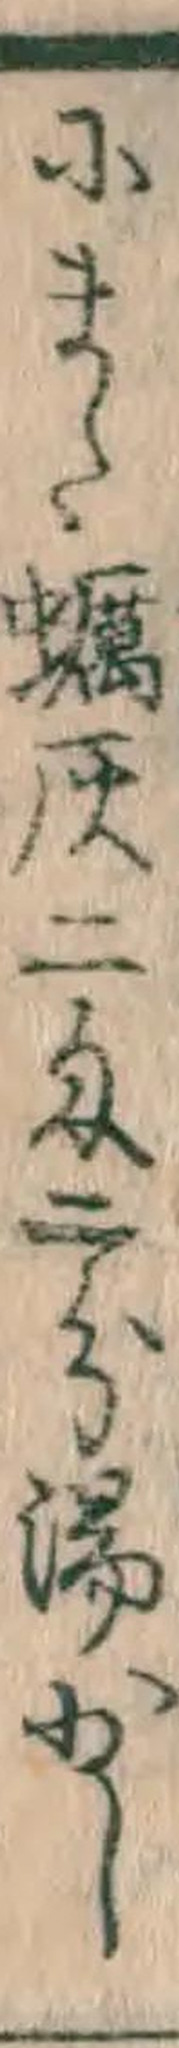にまた蠣灰二匁二分湯少し
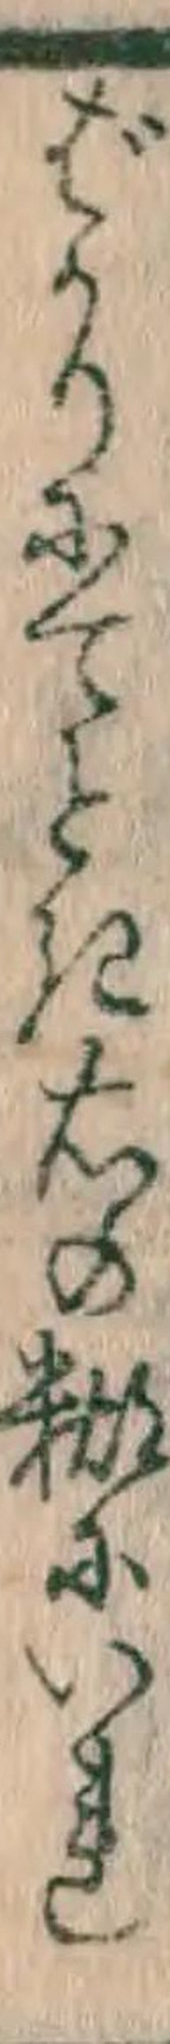ばかりにてとき右の糊にいれ
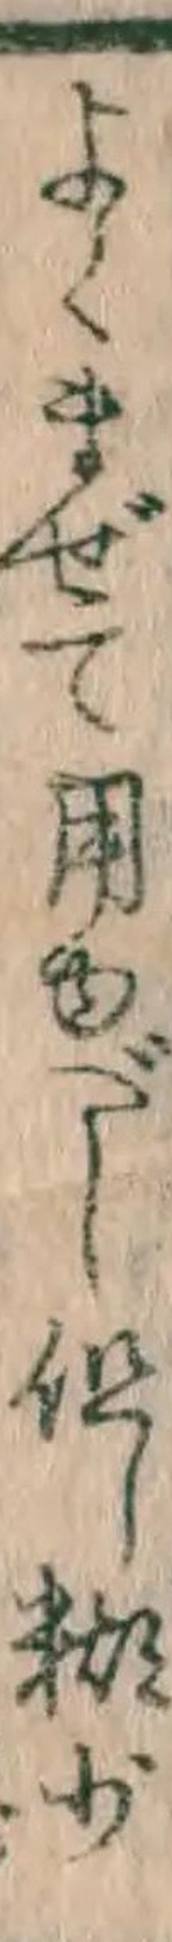よくまぜて用ゆべし但し糊少
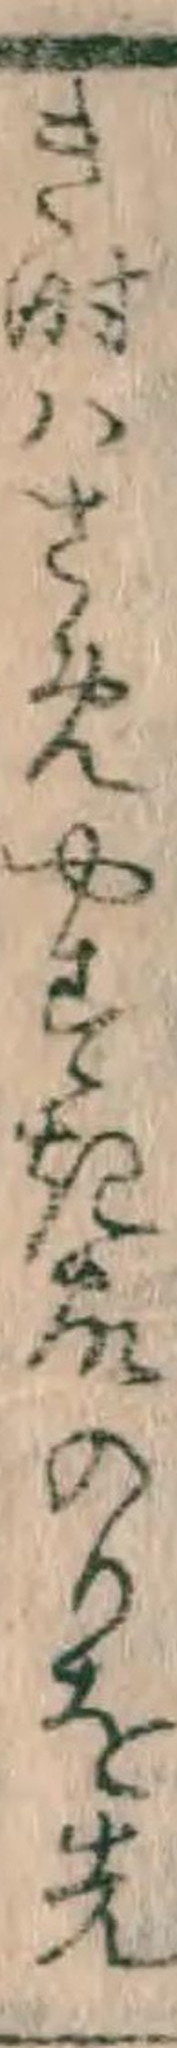き時はさめやすき故のりを先
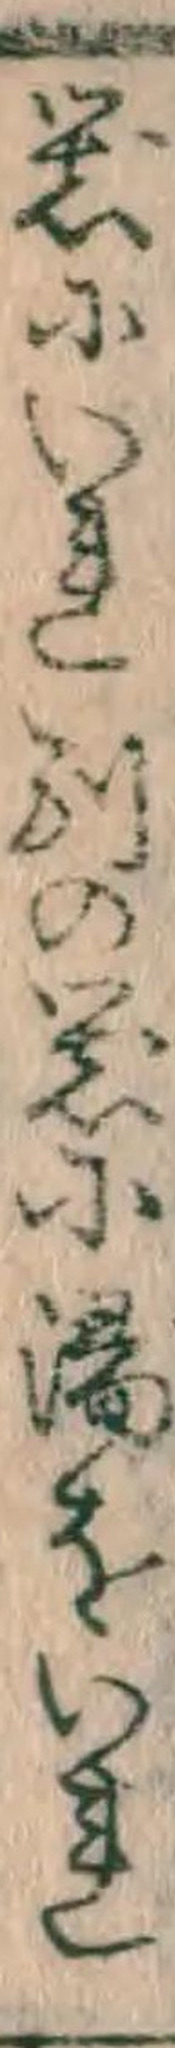器にいれ別の器に湯をいれ
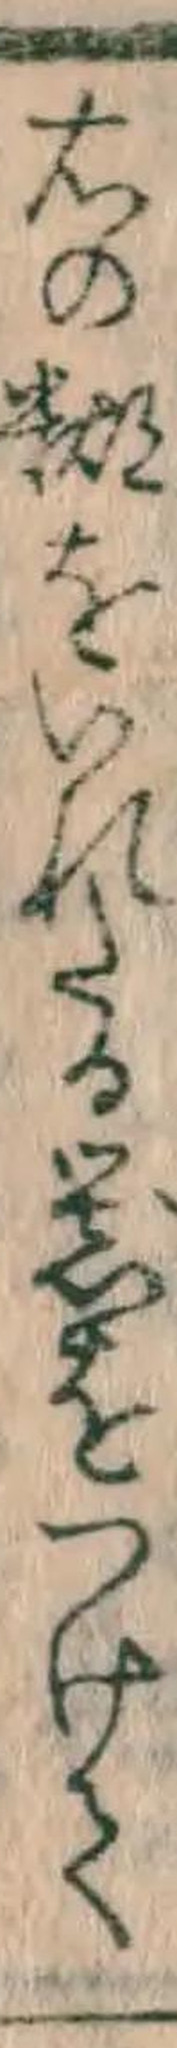右の糊をいれたる器をつけて
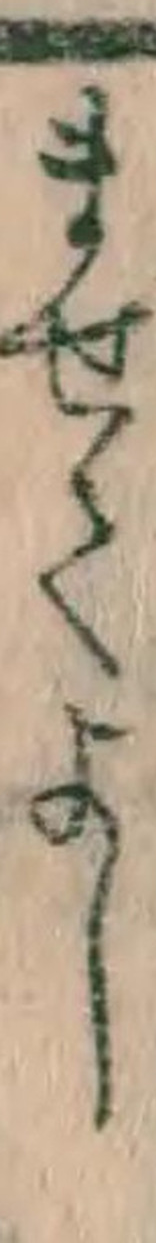まぜてよし
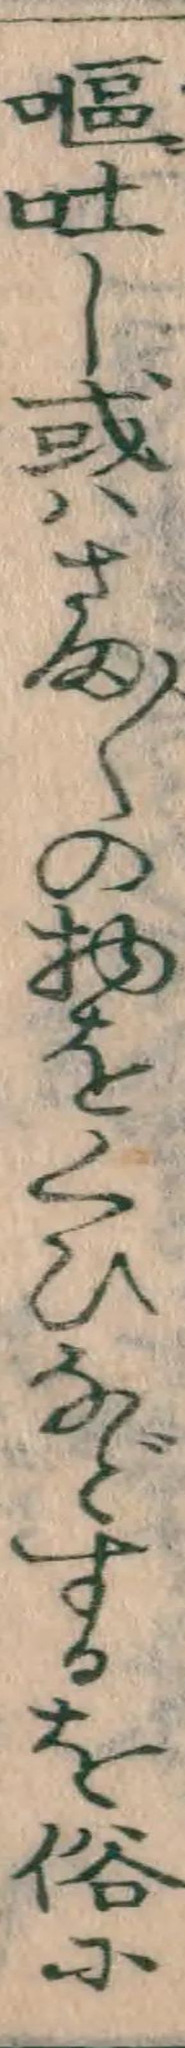嘔吐し或はさま〴〵の物をくひなどするを俗に
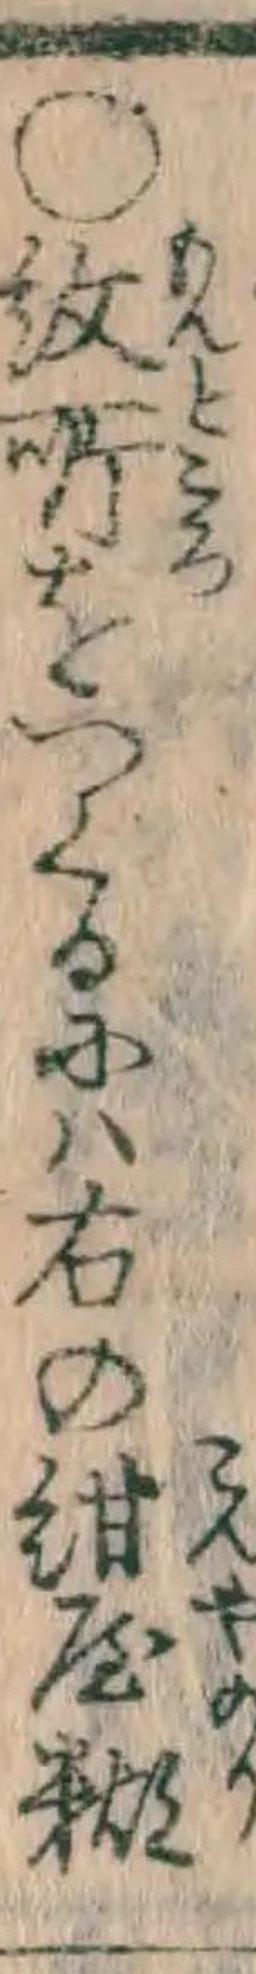○紋所をつくるには右の紺屋糊
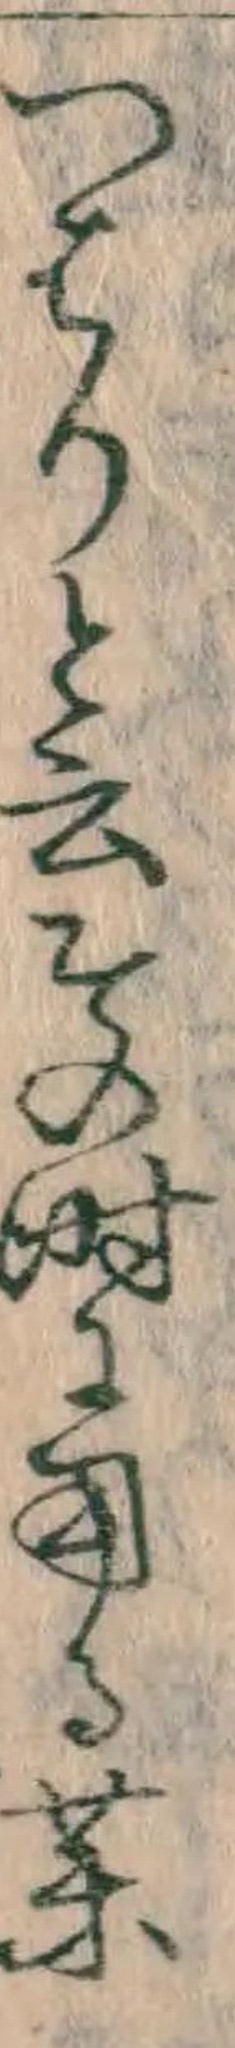つはりと云その時に用る薬
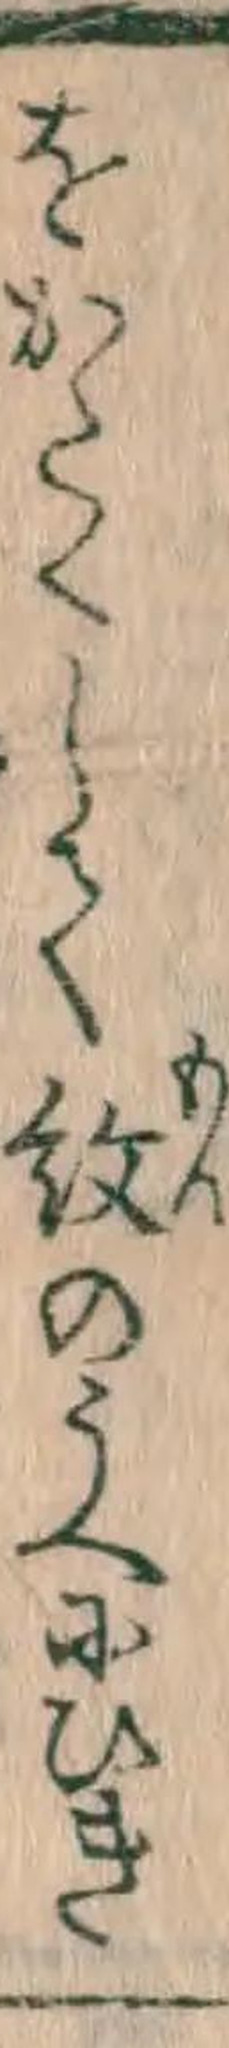をかたくして紋のうへにひき
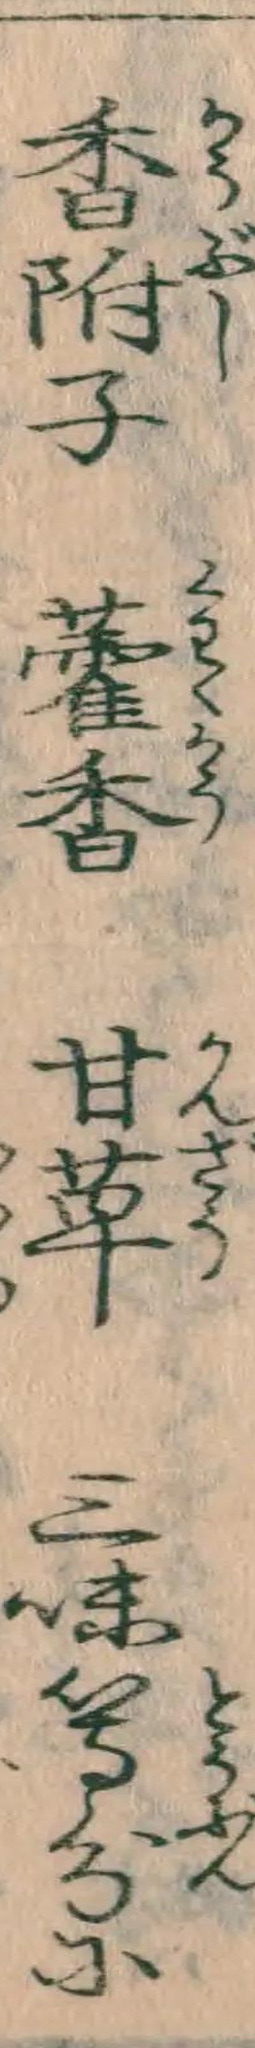香附子藿香甘草三味等分に
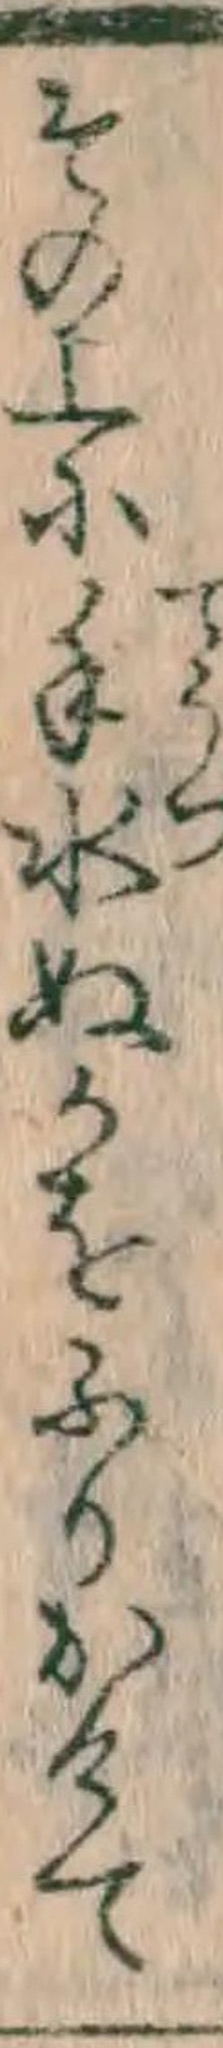その上に手水ぬかをふりかけて
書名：広益秘事大全 3巻. [3]
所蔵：国立国会図書館 National Diet Library, JAPAN
